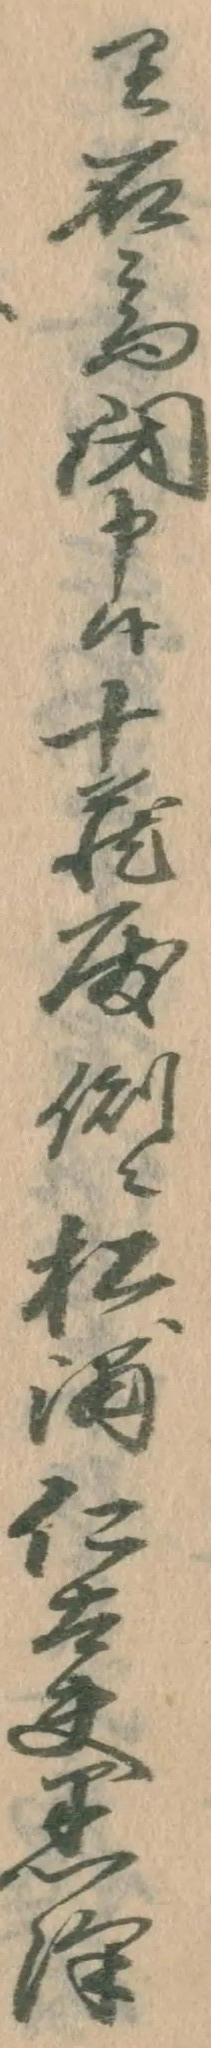里石に而閉申候十蔵殿例に松浦仁太夫黒沢
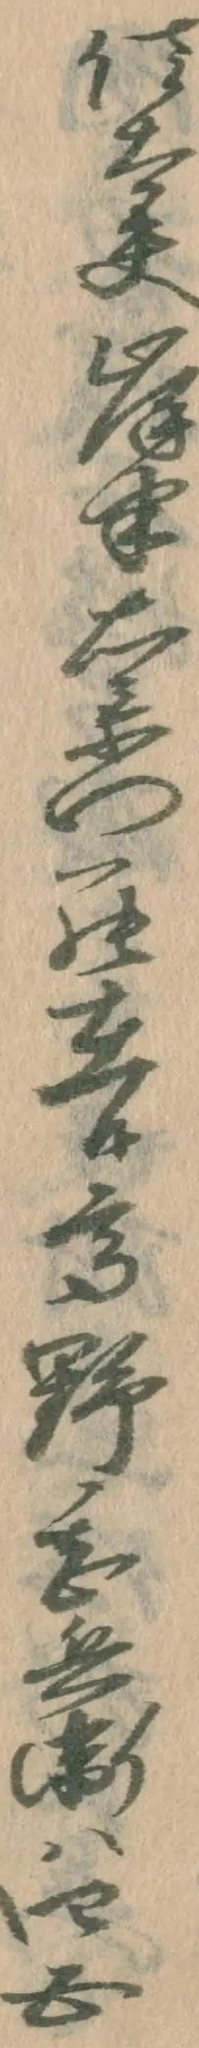佐太夫岸半右衛門罷在候高野甚兵衛は四五
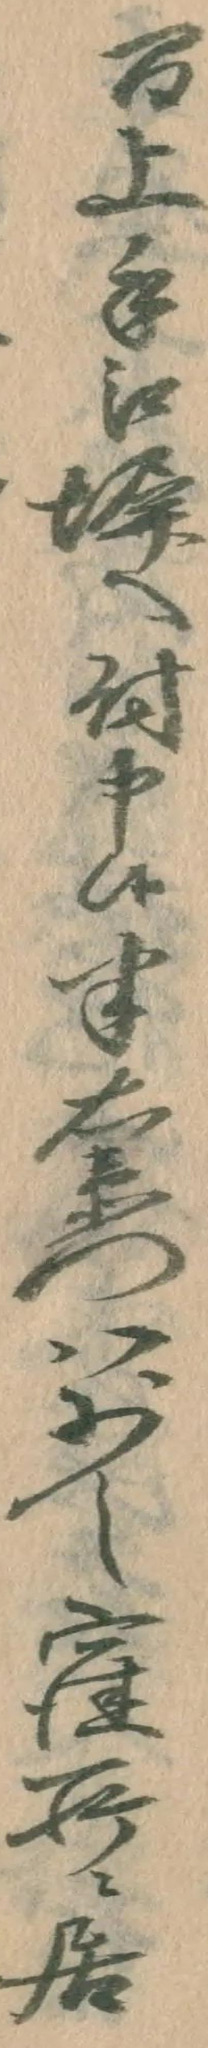間上手江塀へ付申候半右衛門は少し窪所に居
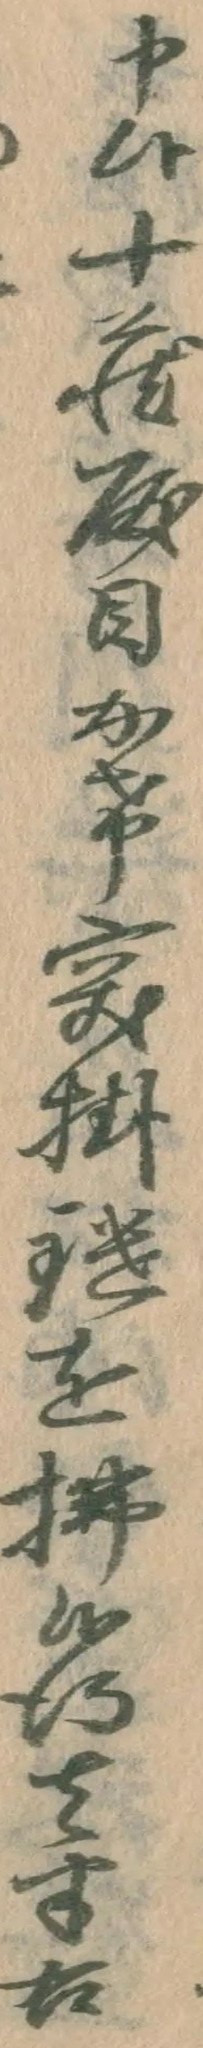申候十蔵殿目加希突掛鑓を払候得者半右
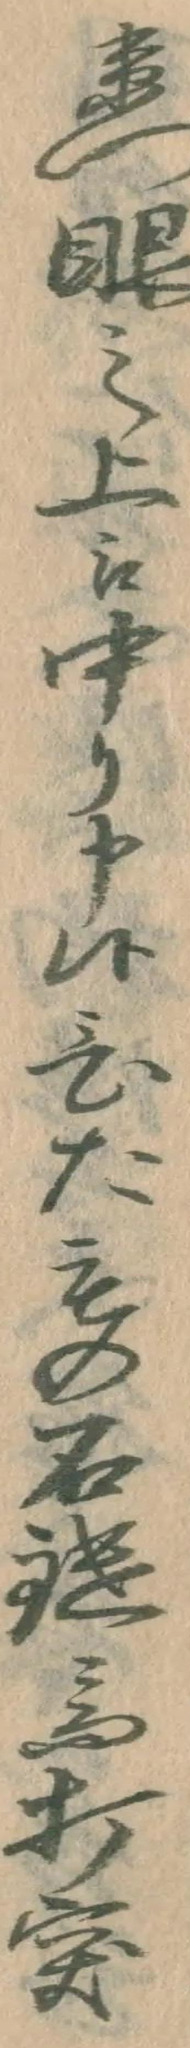衛門眼之上江中り申候ひたもの石鑓に而打突
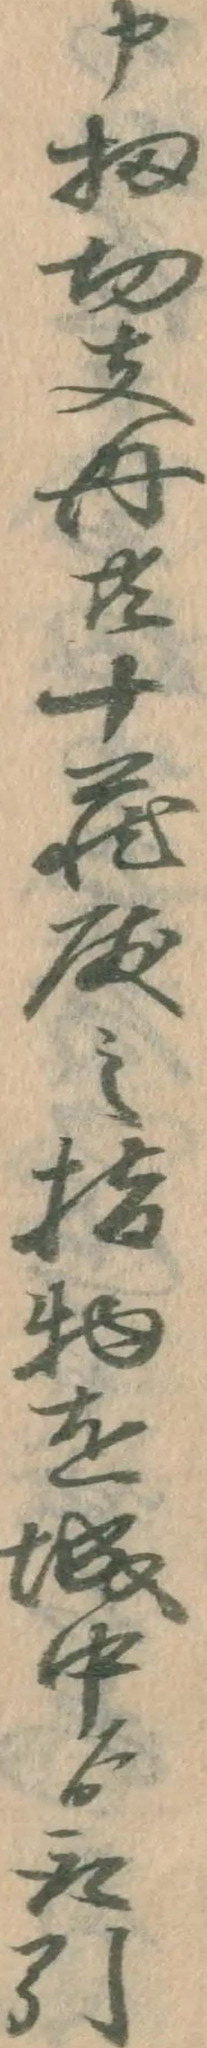申扨切支丹共十蔵殿之指物を城中ゟ取引
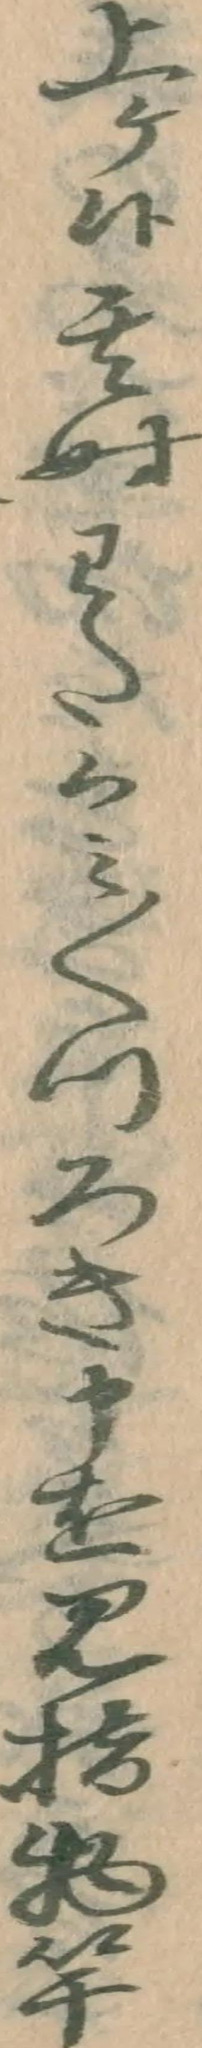上け候其時已たか之く川ろき申を見指物竿
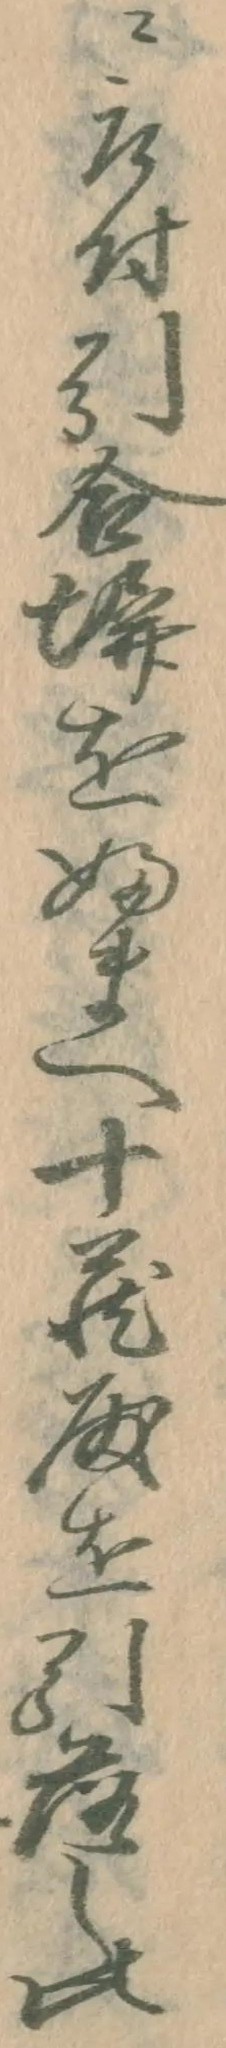に取付引合塀を婦まへ十蔵殿を引落し此

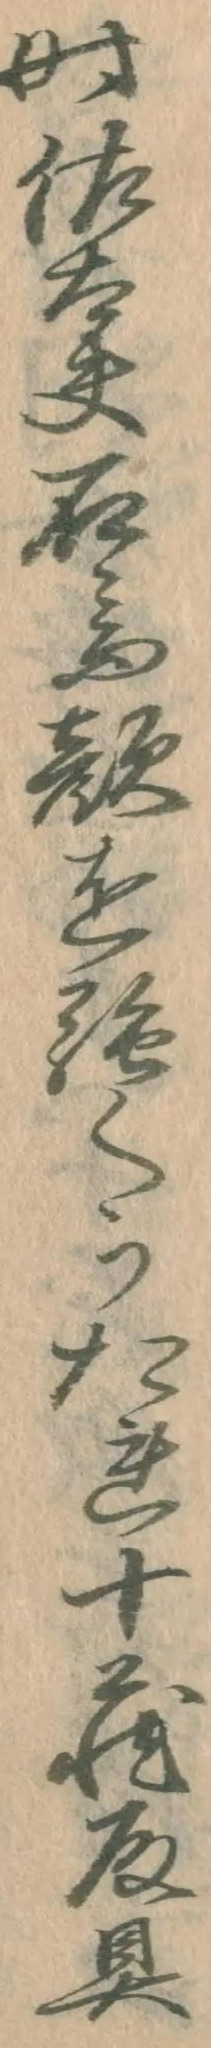時佐太夫石に而顔を強くうた連十蔵殿具
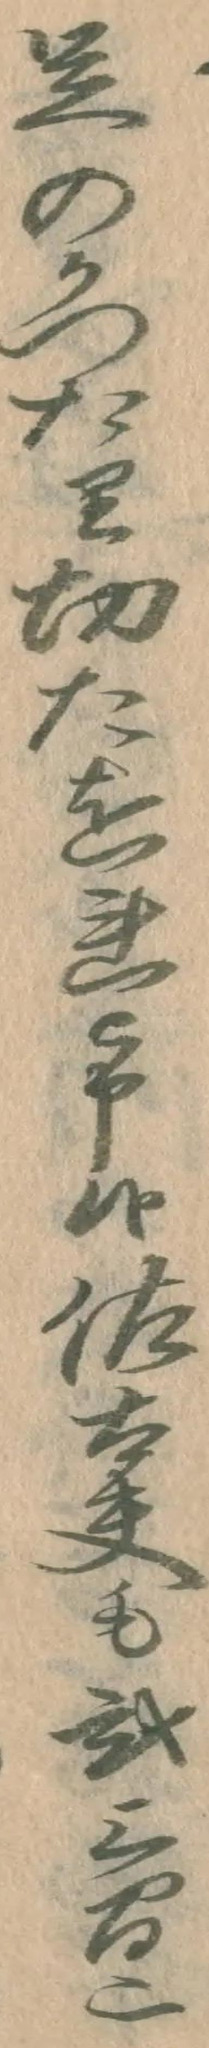足のかつた里切たを連被申候佐太夫も弐三間こ
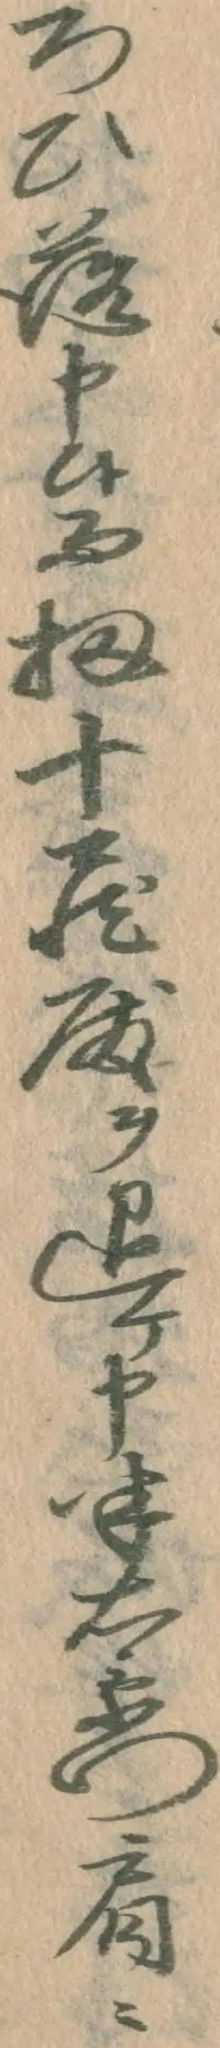ろひ落申候而扨十蔵殿を退け申半右衛門肩に
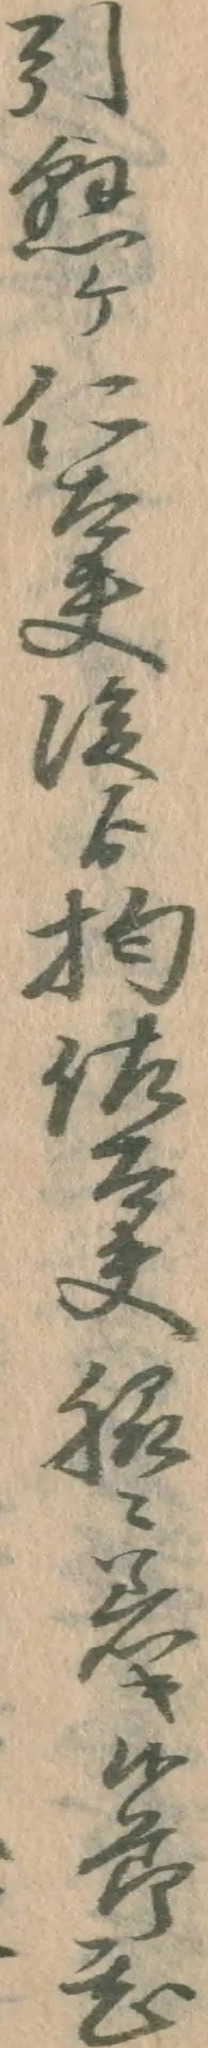引懸け仁太夫後ゟ拘佐太夫脇に着き候節甚
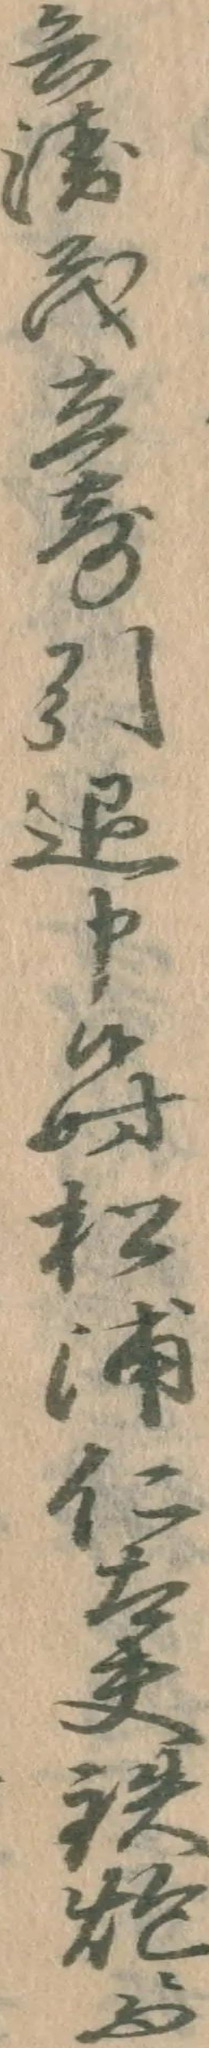兵衛茂立寄引退申候時松浦仁太夫鉄炮に而
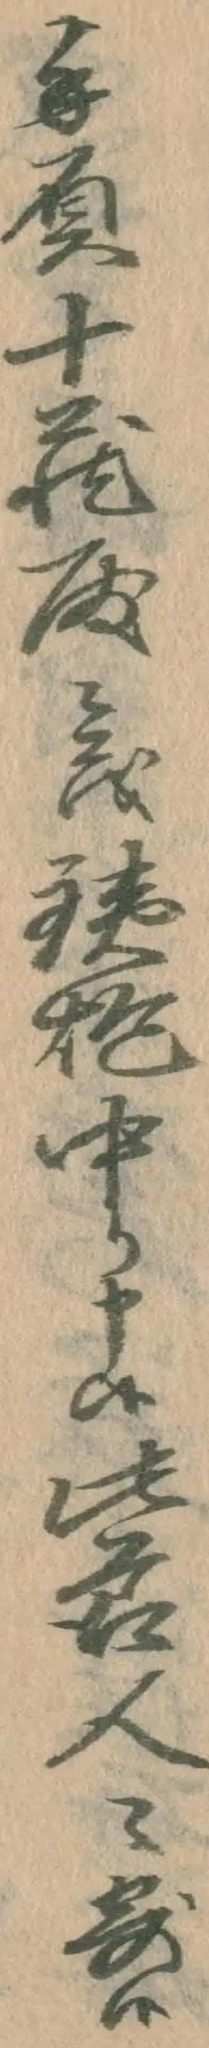手負十蔵殿に茂鉄炮中り申候此節人々寄候
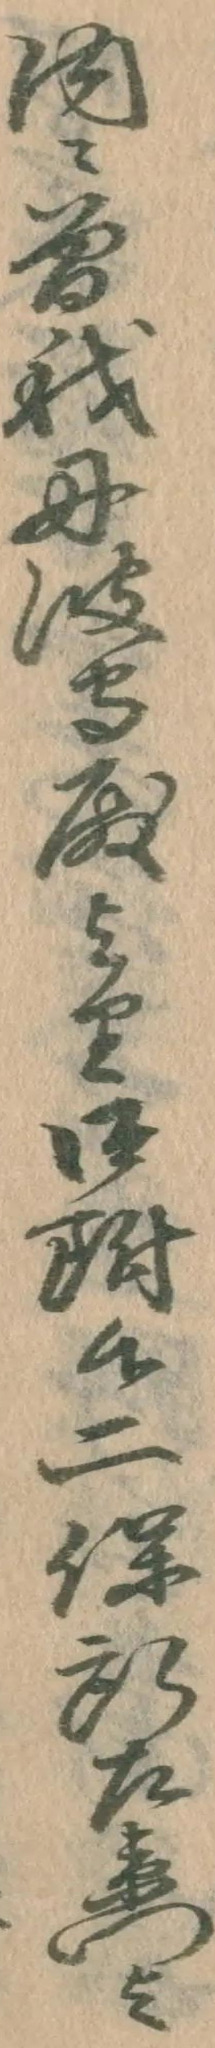内に曽我丹波守殿与里御附候二保新左衛門与
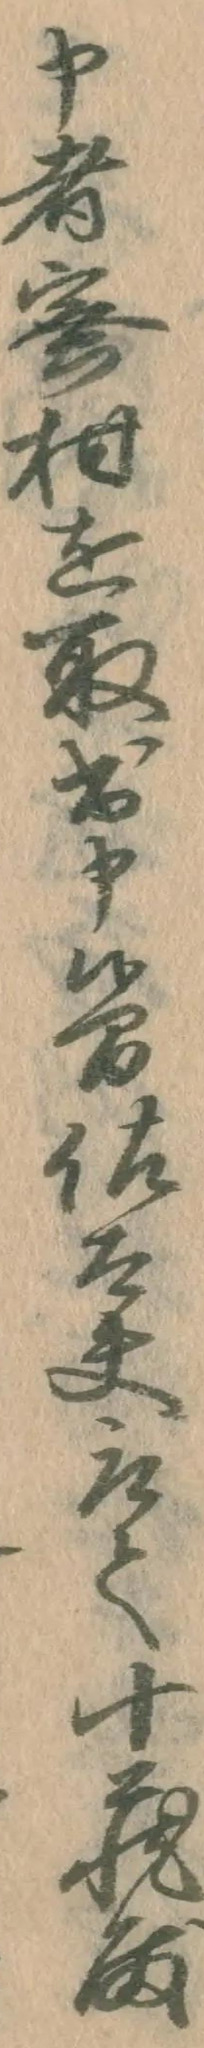申者密村を取出申候間佐太夫取て十蔵殿
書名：切支丹御退治記 49巻. [5]
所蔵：国立国会図書館 National Diet Library, JAPAN
